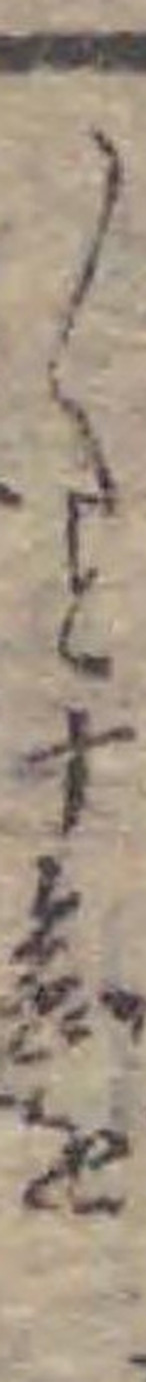〳〵と十念を
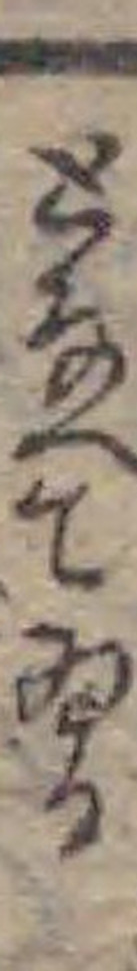となへてゐる
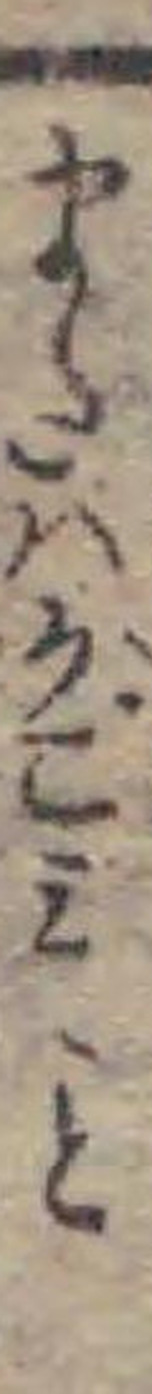またはかごみゝと
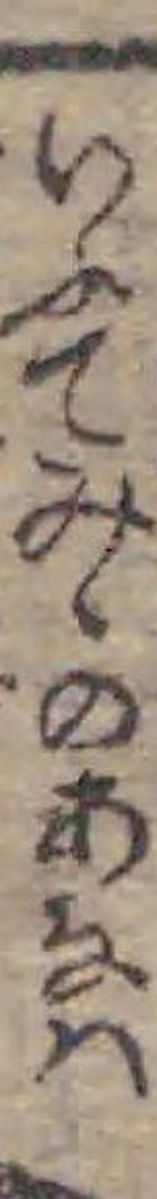いふてみゝのあなは
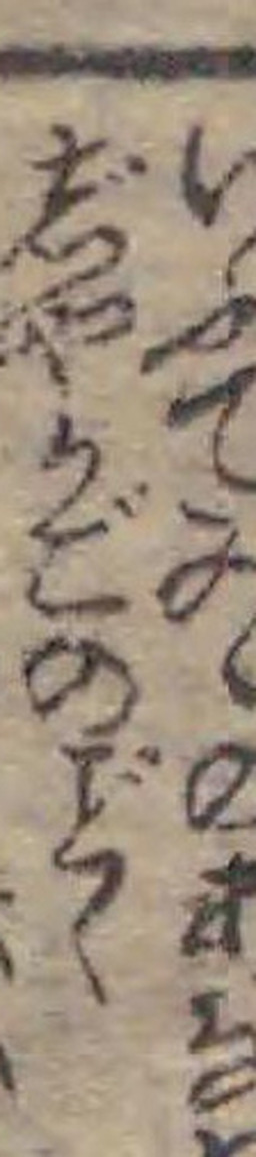じやうごのごとく
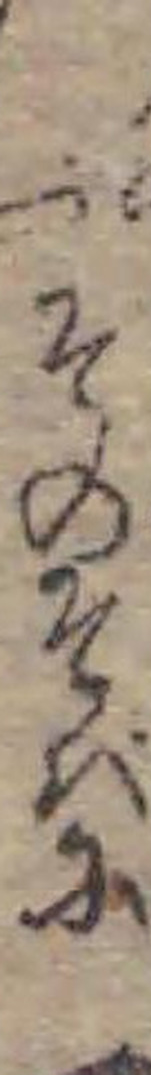そのそばに
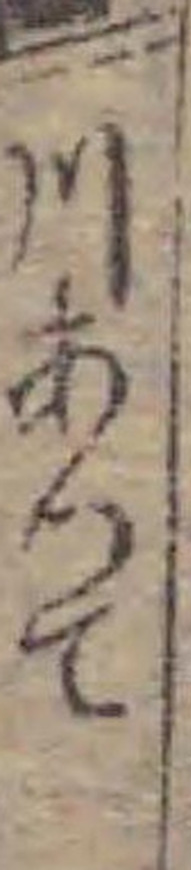川あつて
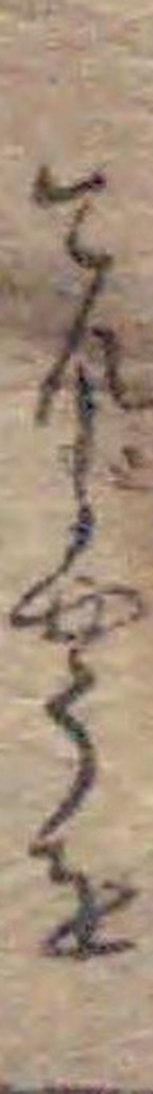てんじやうを
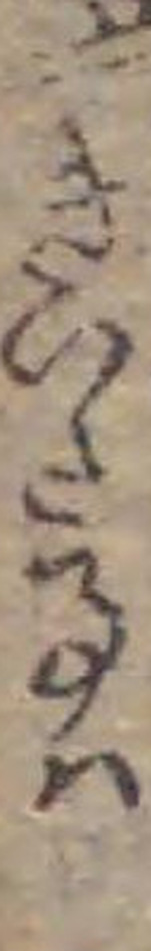きいた事は
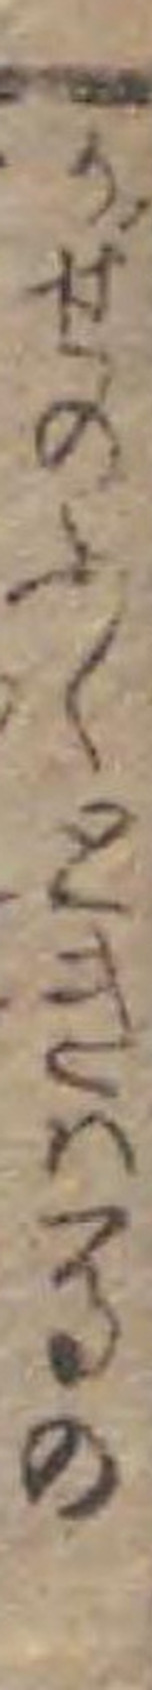かぜのふくときは馬の
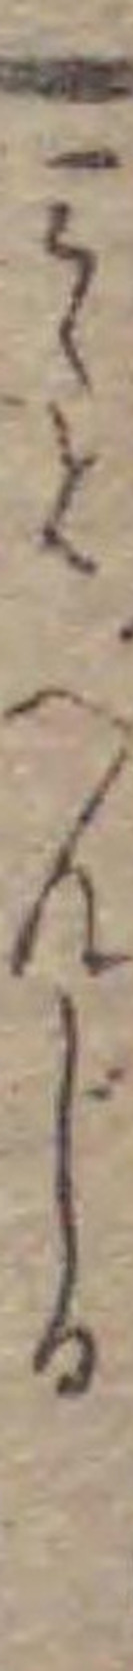みゝとへんじる
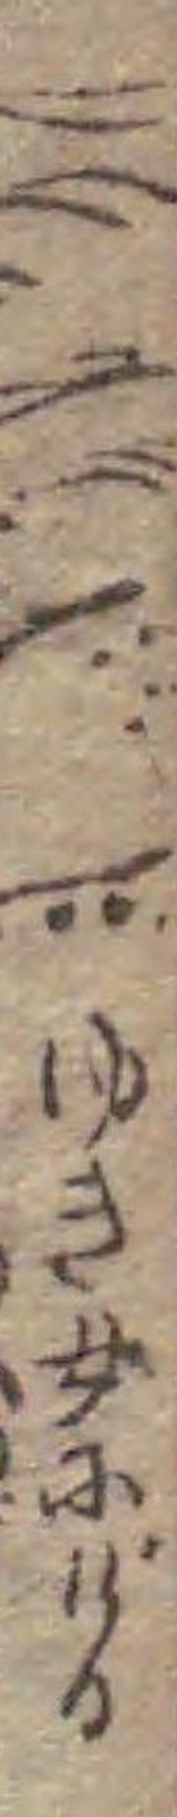ゆき女にげる
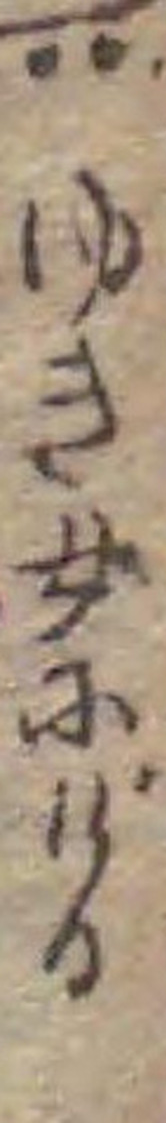ゆき女にげる
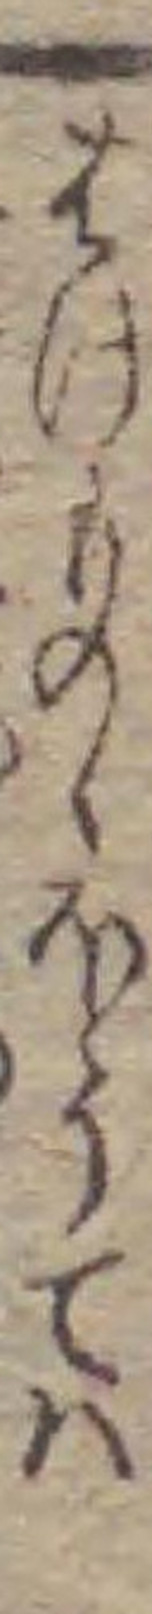はけものゝほうては
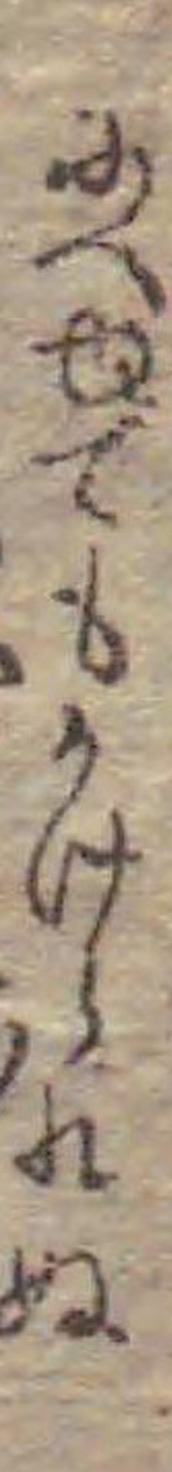にへゆでもかけられぬ
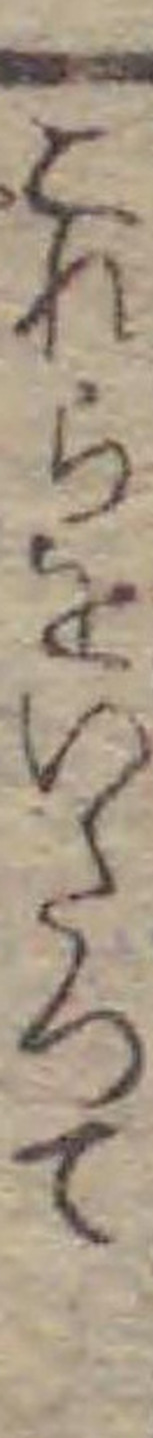これらをいたつて
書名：怪物つれつれ草 : 2巻
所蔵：国立国会図書館 National Diet Library, JAPAN
